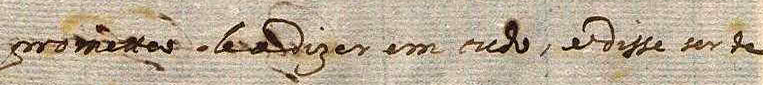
prometteo de a dizer em tudo, e disse ser de
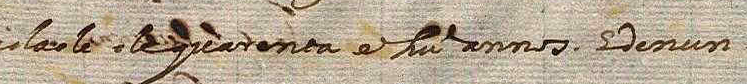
idade de quarenta e hū annos. E denun
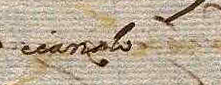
ciando
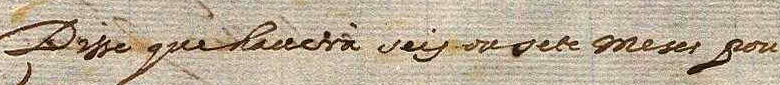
Disse que hauera seis ou sete meses pou
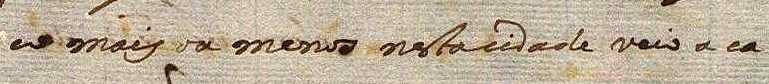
co mais ou menos nesta cidade veio a ca
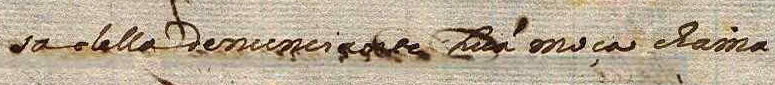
sa della denunciante huā moça chama
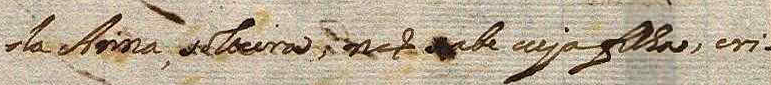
da Anna, solteira, naõ sabe cuja filha, cri
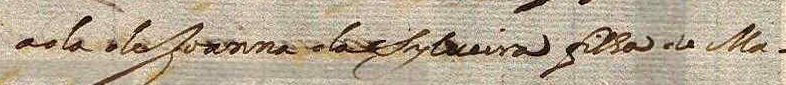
ada de Joanna da Sylueira filha de Ma
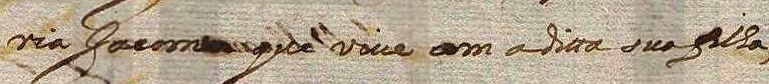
ria Jacome que viue com a ditta sua filha,
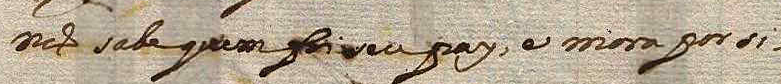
naõ sabe quem foi seu pay, e mora por si
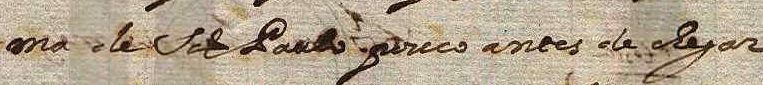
ma de Saõ Paulo pouco antes de chegar
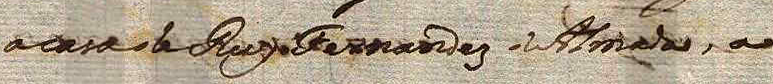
a casa de Ruy Fernandez de Almada, ao
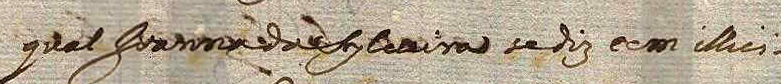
qual Joanna da Sylveira se diz tem illici
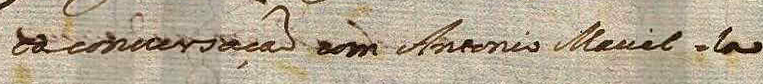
ta conuersaçaõ com Antonio Maciel da
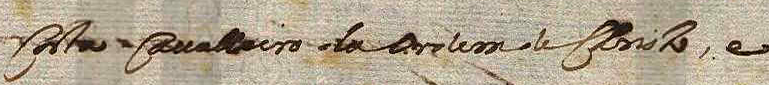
Costa Cavalleiro da Ordem de Christo, e
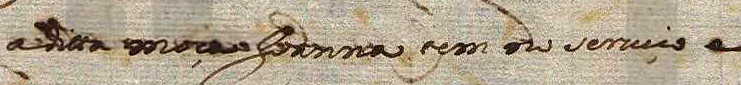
a ditta moça Joanna tem no serviço e
